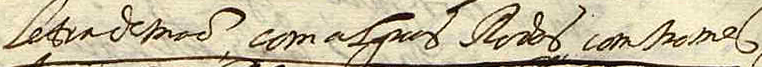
Letra de maõ, com alguās Rodas, com nomes
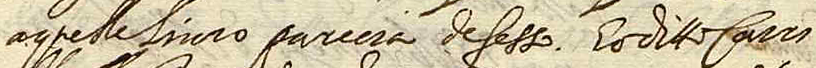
aquelle Liuro parecia defesso. E o ditto Carri
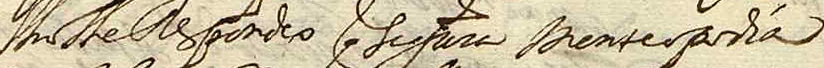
lho lhe Respondeo q̄ seguramente o podia
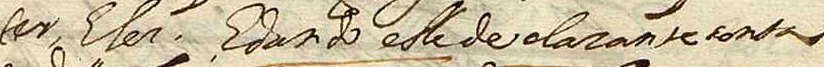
ter, E ler. E dando elle declarante conta
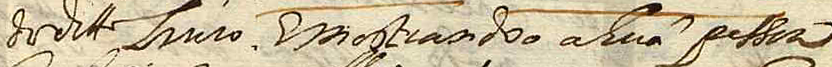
do ditto Liuro. E mostrandoo a huā pessoa
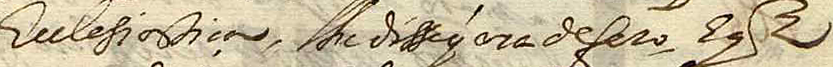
Ecclesiastica, lhe disse q̄ era defezo, E q̄
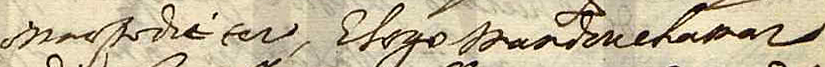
o naõ podia ter, E logo mandou chamar
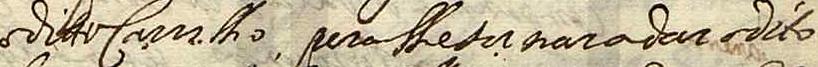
o ditto Carrilho, pera lhe tornar a dar o dito
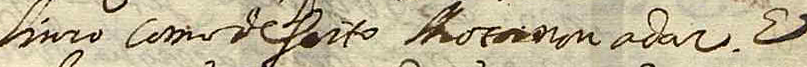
Liuro como de feito lho tornou a dar. E
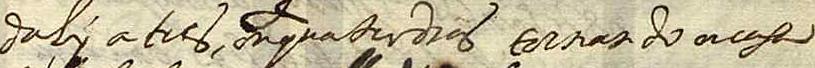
daly a tres, ou quatro dias tornando a casa
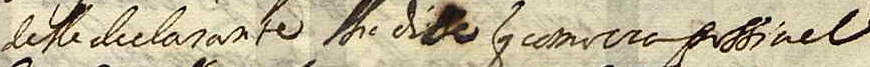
delle declarante lhe disse q̄ como era possiuel
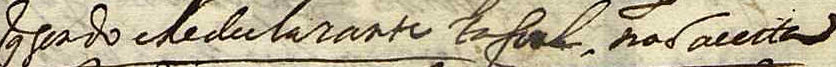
q̄ sendo elle declarante taful, naõ aceita
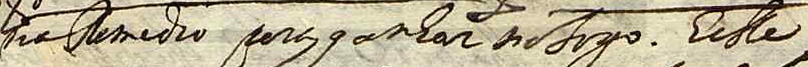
ua Remedio pera ganhar no Iogo. E elle
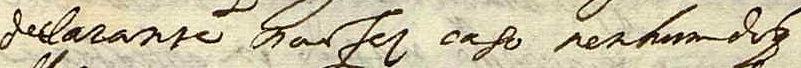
declarante naõ fez caso nenhum do q̄
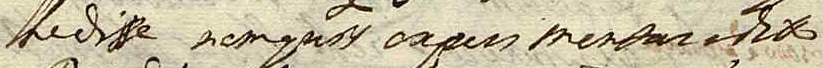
lhe disse nem quis experimentar o ditto
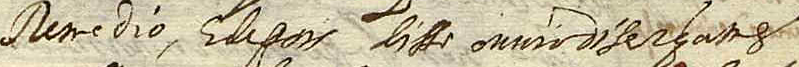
Remedio, E depois disso ouuio diser q̄ a mes
